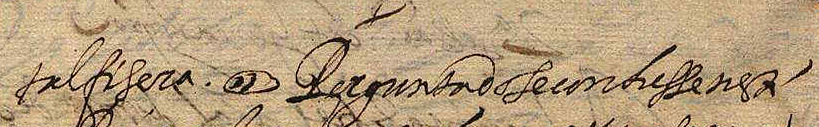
tal fizera. ⁋ Perguntado se conhesse neste
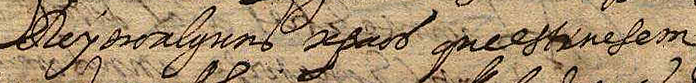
Reyno alguns xpaõs que estiuesem
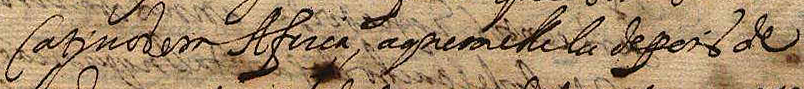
Catiuos em Africa, a quem elle la depois de
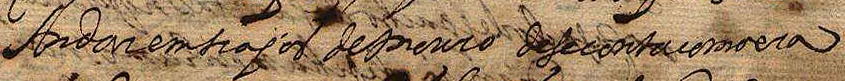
Andar em trajos de mouro dese conta como era
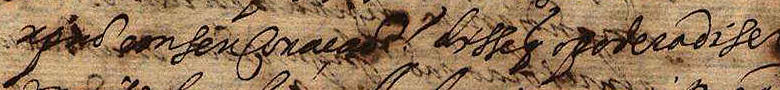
xpaõ em seu Coraçaõ? disse q̄ o podera diser
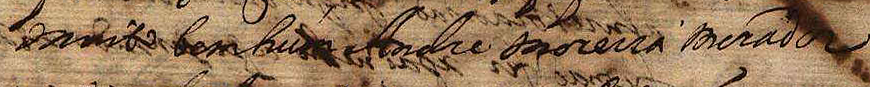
muito bem hum Andre moreira morador
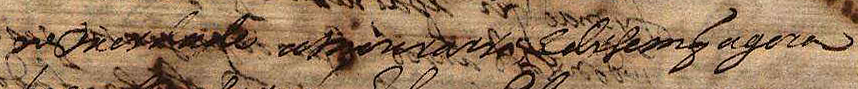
nesta cidade a mouraria, E disem q̄ agora
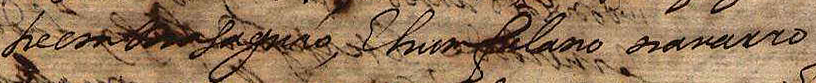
he em Masaguaõ, E hum fulano nauarro
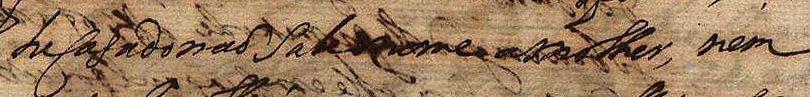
he Cazado naõ sabe o nome a molher, nem
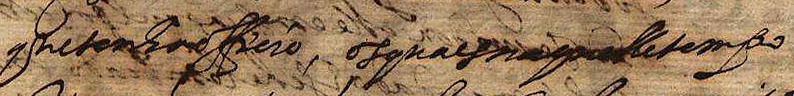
que tenha officio, os quaes naquelle tempo
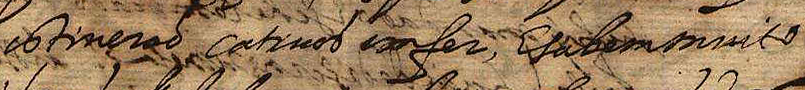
estiueraõ catiuos em fez, E sabem muito
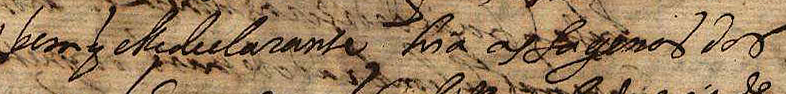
bem q̄ elle declarante hia as sagenas dos
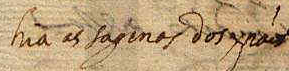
hia as sagenas dos xpaõs
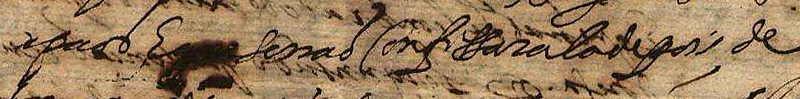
xpaõs E que se naõ Confessara la depois de
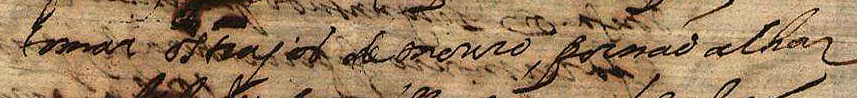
tomar os trajos de mouro, por naõ achar
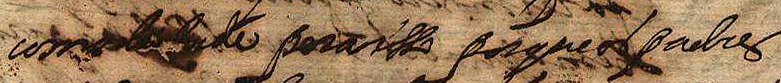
comodidade pera isso porque os padres
